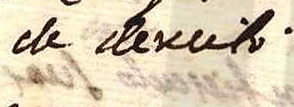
de dereito
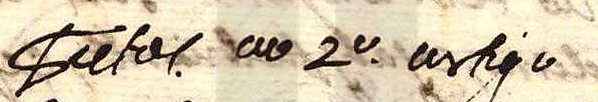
Testas ao 2o. artigo
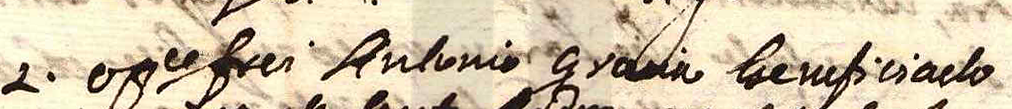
2. o pe frei Antonio gracia beneficiado
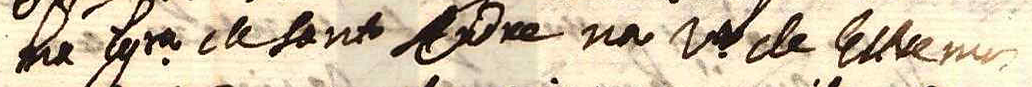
na igra. de Santo Andre na V.a de Estemos
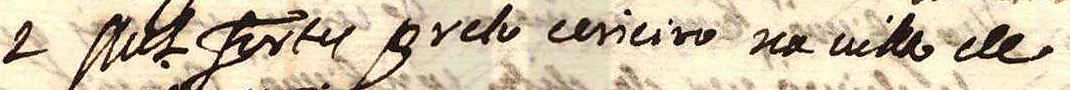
2 Mel Fortes preto cerieiro na uilla de
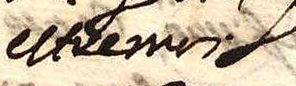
estremos
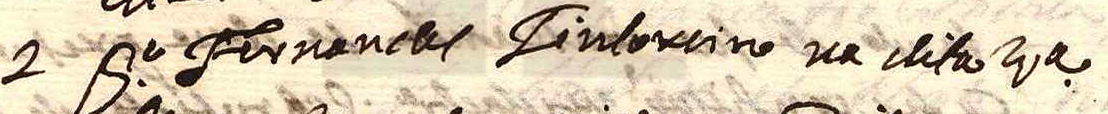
2 p.o Fernandes Tintoreiro na dita V.a
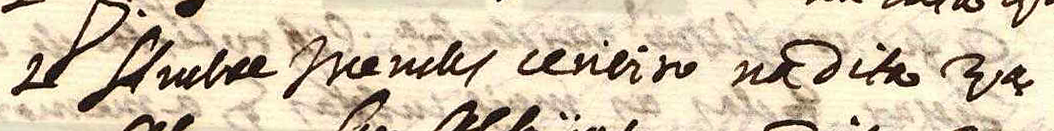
2 Andre Mendes cerieiro na dita V.a
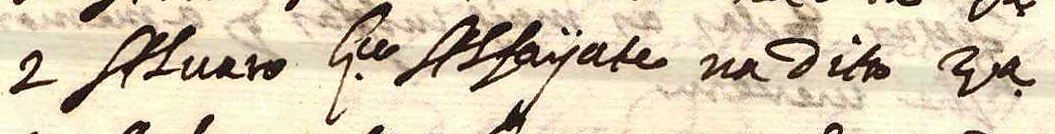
2 Aluaro G.a Alfayate na ditta V.a
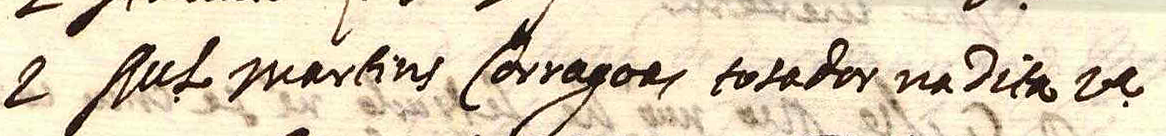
2 Mel martins Corragoas tosador na dita v.a
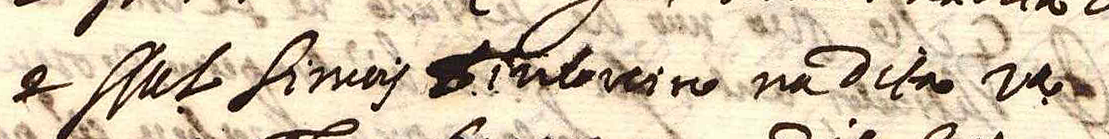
2 Mel Simois Tintoreiro na dita v.a
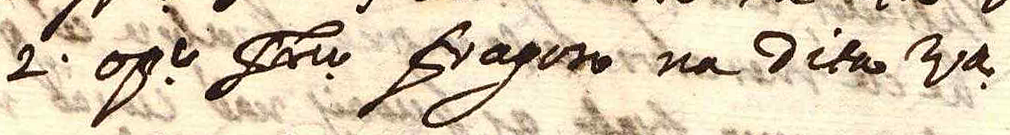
2. o p.e Fr.co fragozo na dita V.a
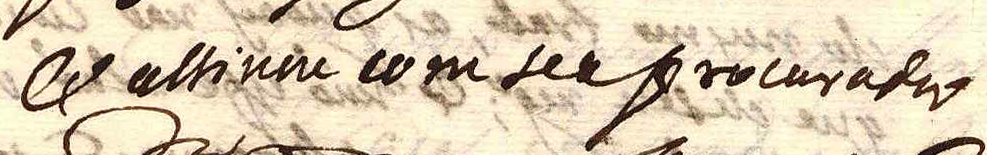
& assinou com seo procurador
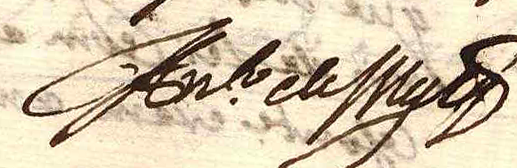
Ant.o de Mges
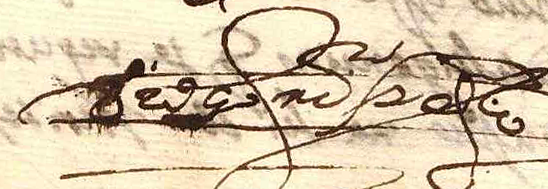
diogo moreno
